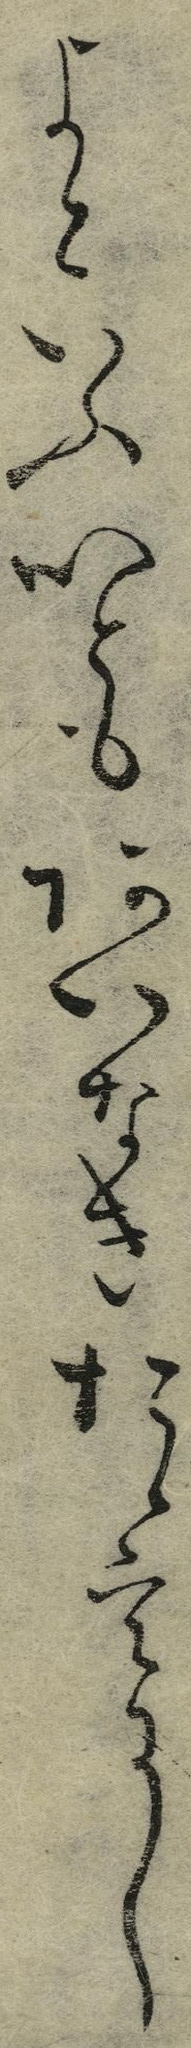よといふいともあいなきたゞ言にし
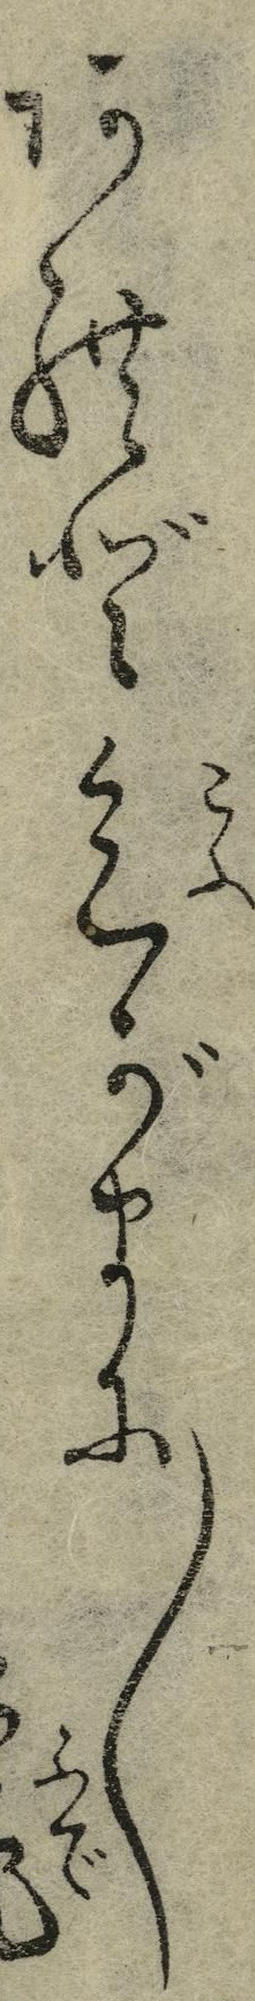あれど乞がまに〳〵
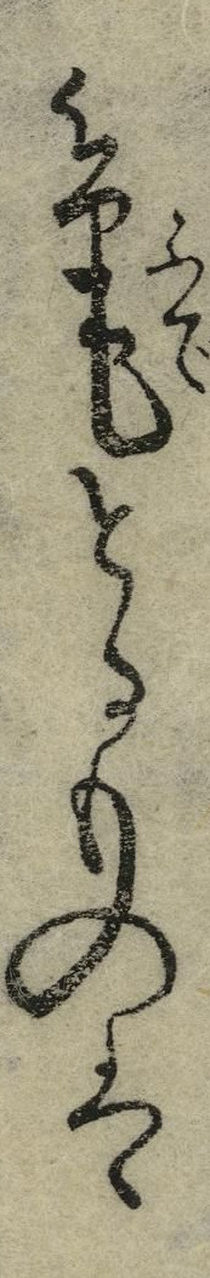筆とるものは
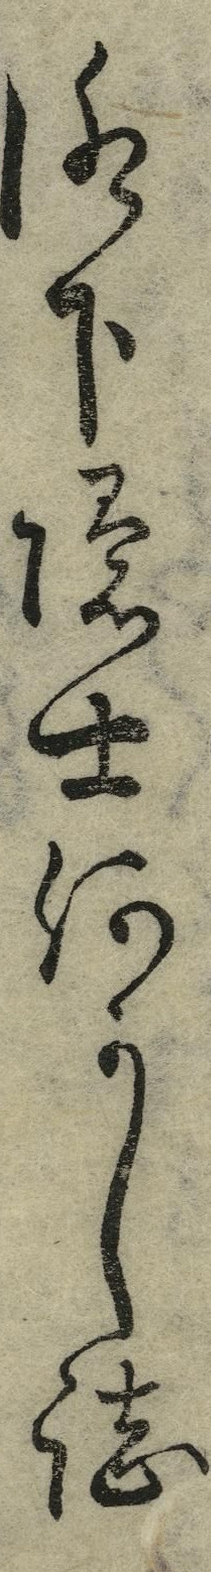洛下隠士何かし誌
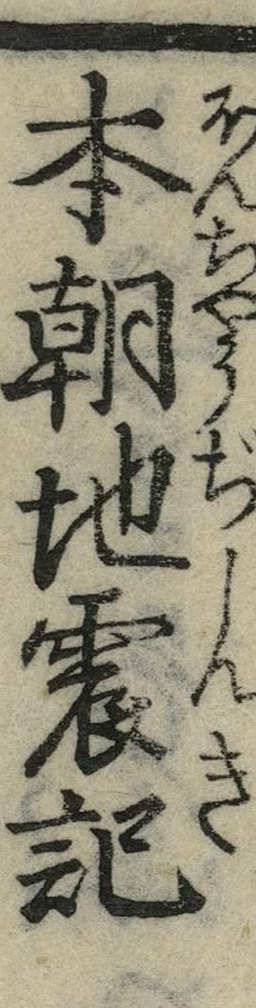本朝地震記
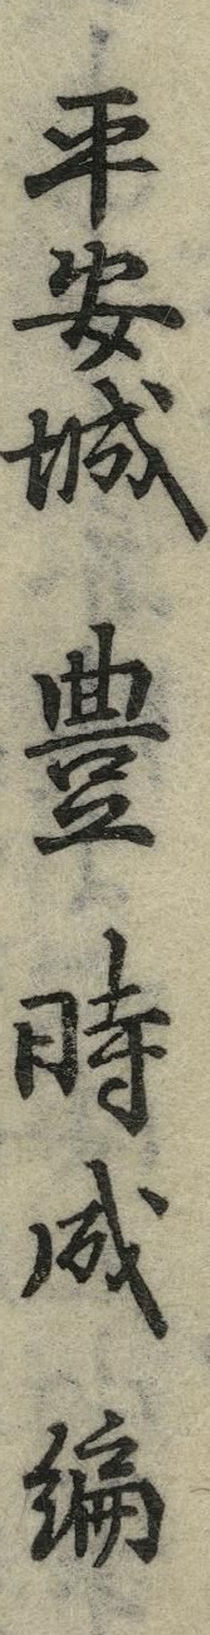平安城豊時成編
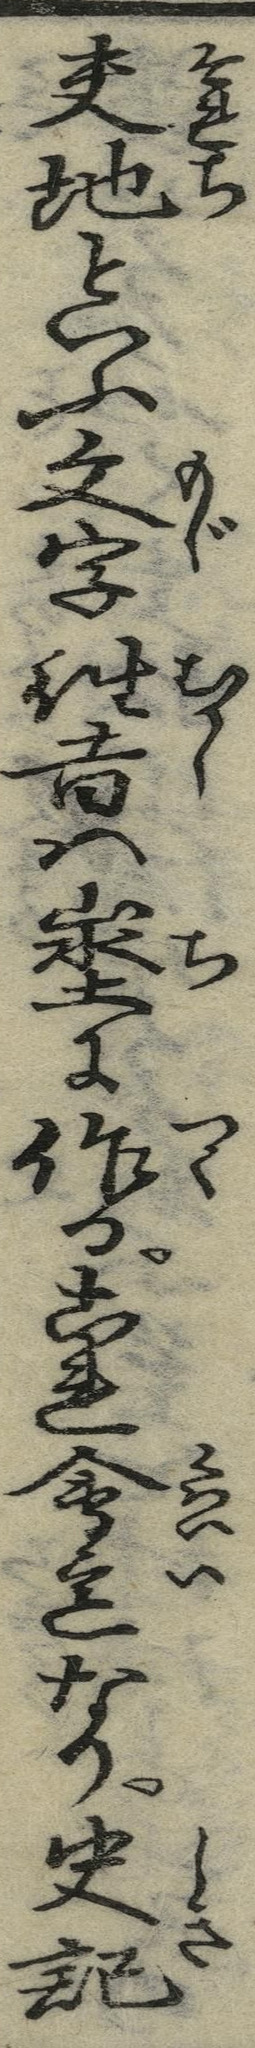夫地といふ文字往昔は埊に作る。これ会意なり。史記
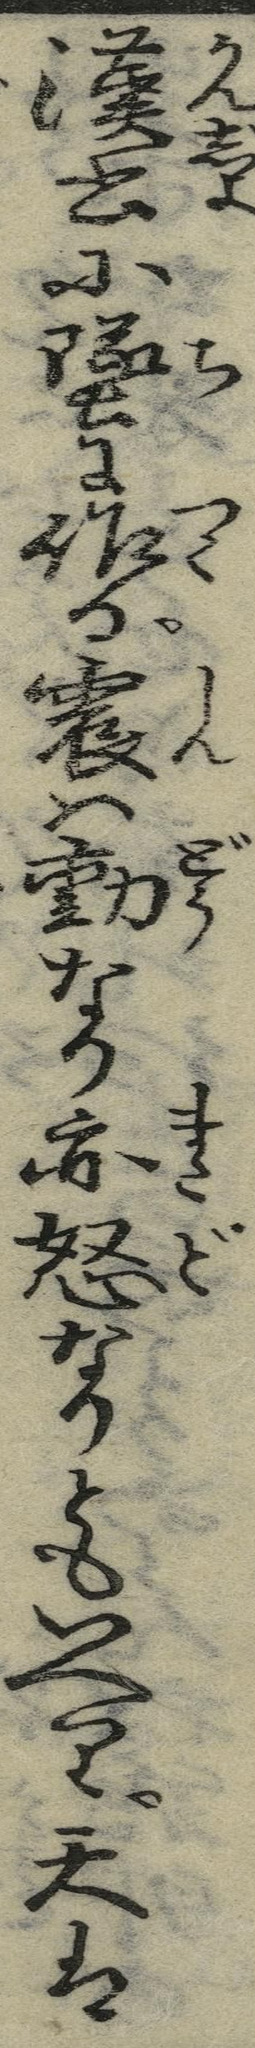漢書に墜に作る。震は動なり亦怒なりともいへり。天は
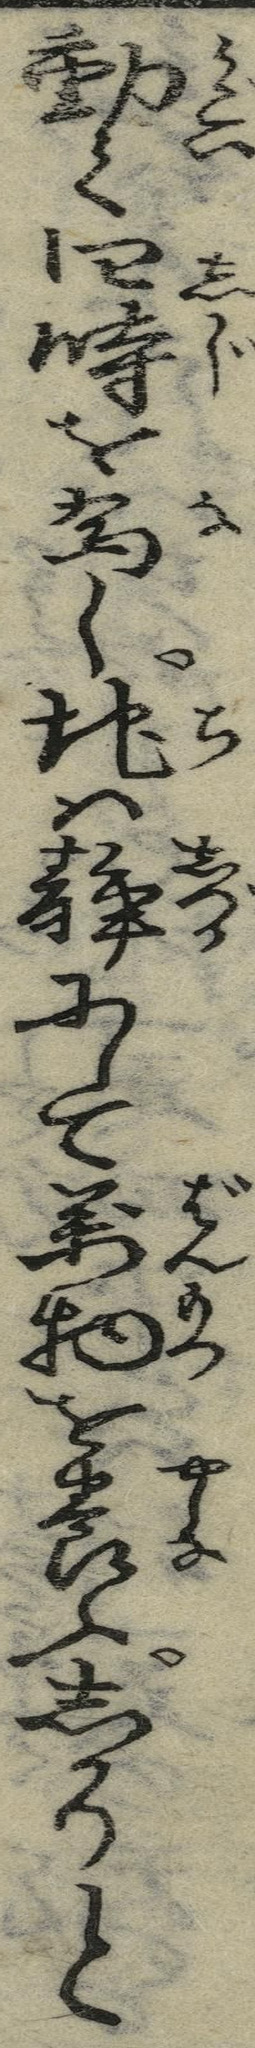動て四時を為し。地は静にして万物を養ふ。しかりと
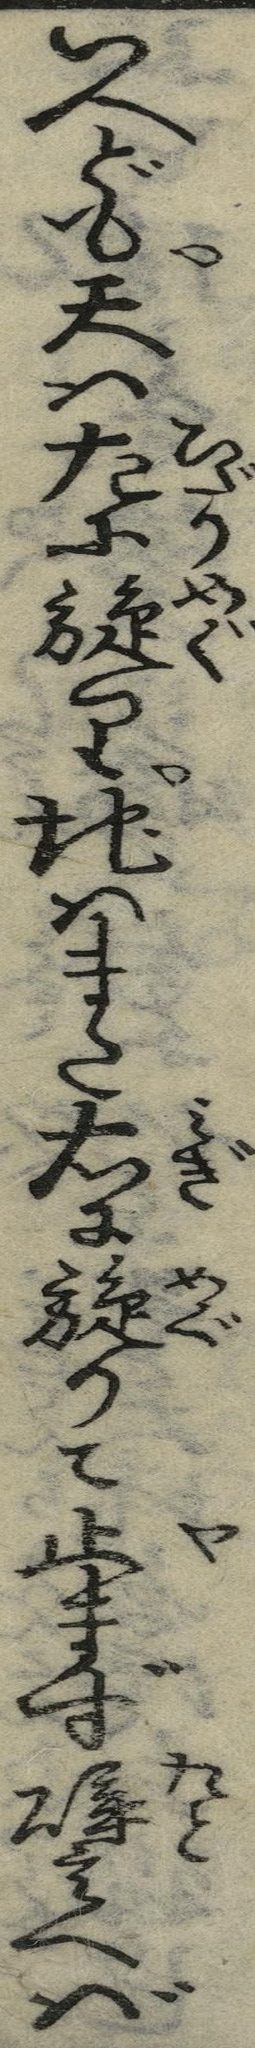いへども。天は左に旋り。地はまた右に旋りて止まず譬へば
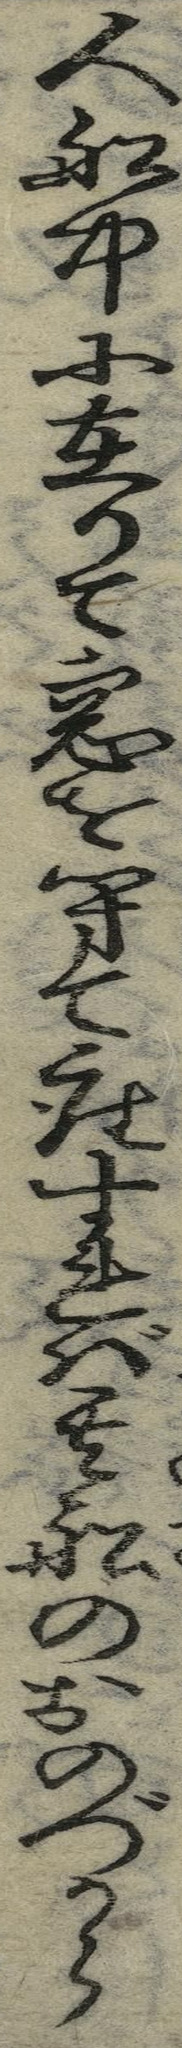人船中に在りて窓を閉て座すれば。其船のおのづから
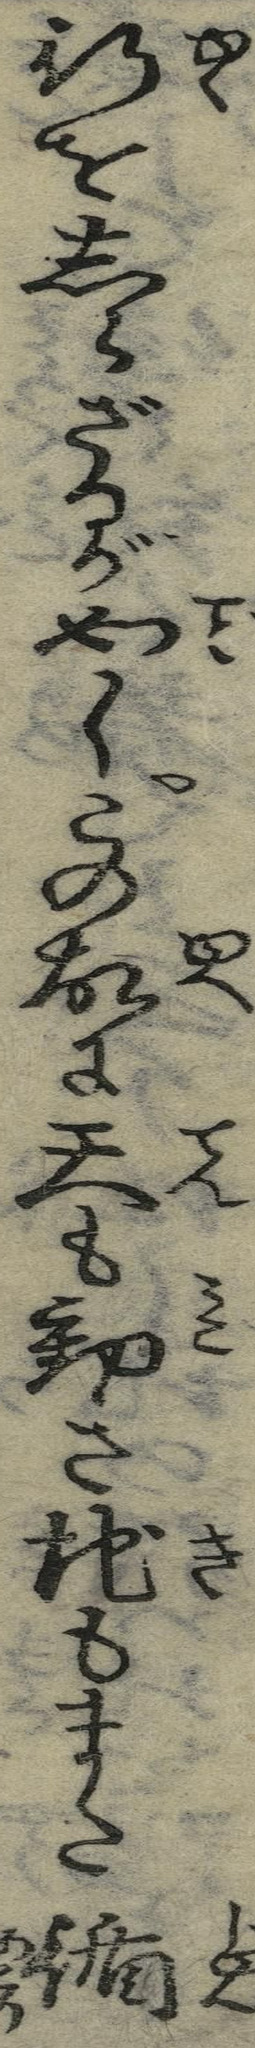行をしらざるが如し。この故に天も動き地もまた循

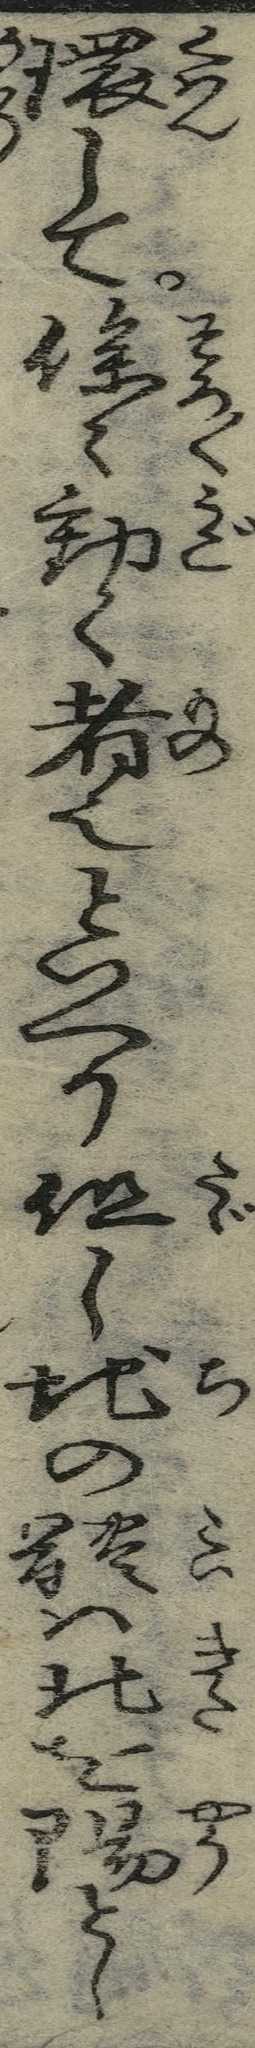環して。徐〻と動く者也といへり但し地の体は北を陽とし
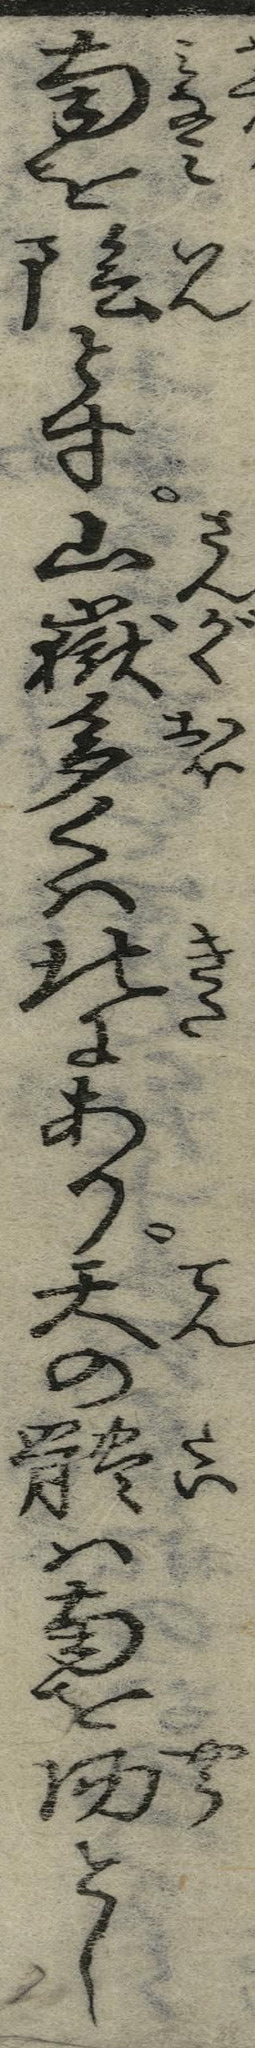南を陰とす。山嶽多くは北にあり。天の体は南を陽とし
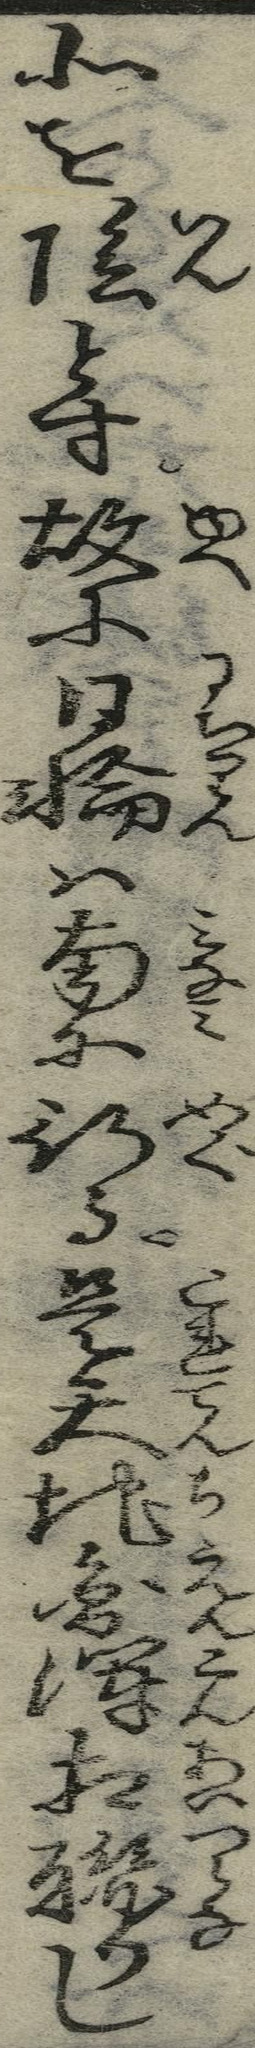北を陰とす。故に日輪は南に行る。是天地円渾相聯りし
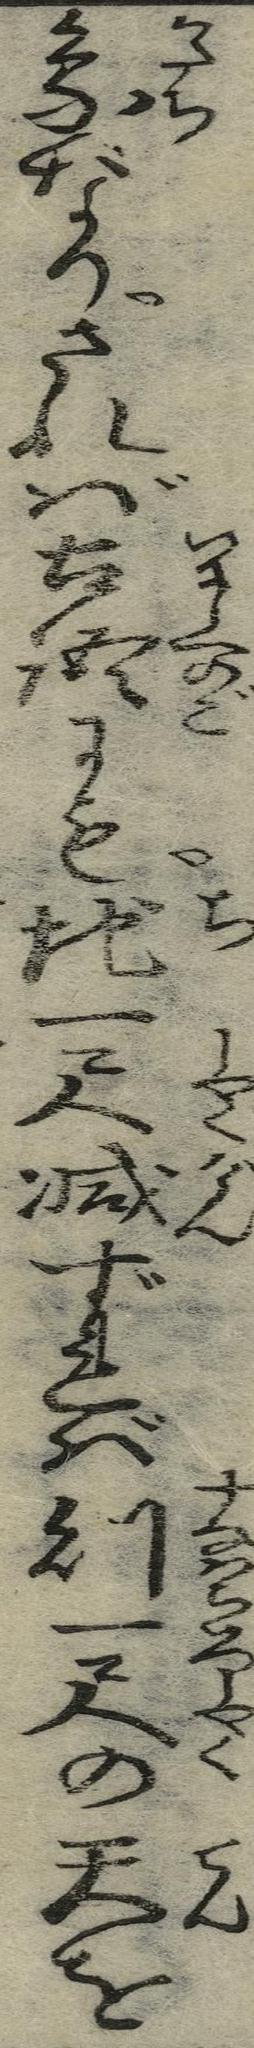象なり。されば古語にも。地一尺減ずれば則一尺の天を
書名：本朝地震記　全
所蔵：東京大学地震研究所図書室 Earthquake Research Institute Library, The University of Tokyo, JAPAN
